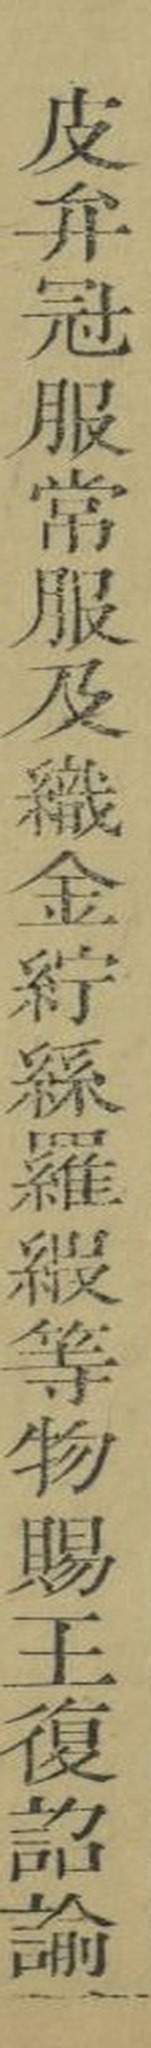皮弁冠服常服及織金紵糸羅緞等物賜王復詔諭
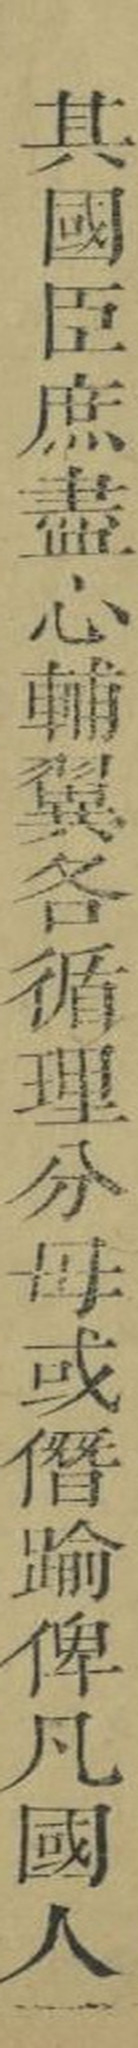其国臣庶尽心輔翼各循理分母或僭踰俾凡国人
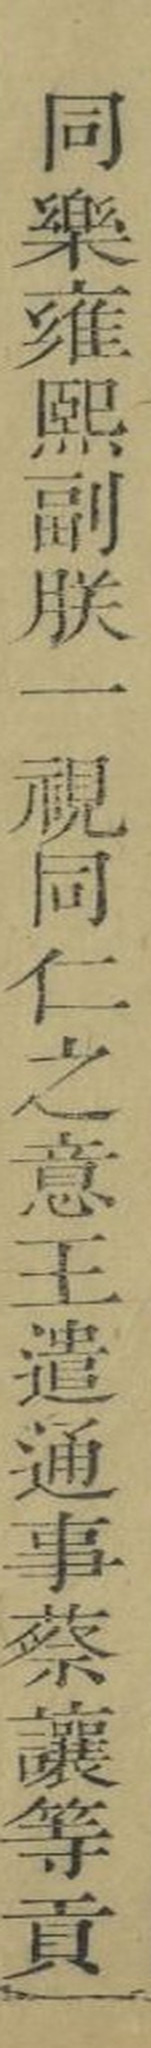同楽雍熙副朕一視同仁之意王遣通事蔡譲等貢
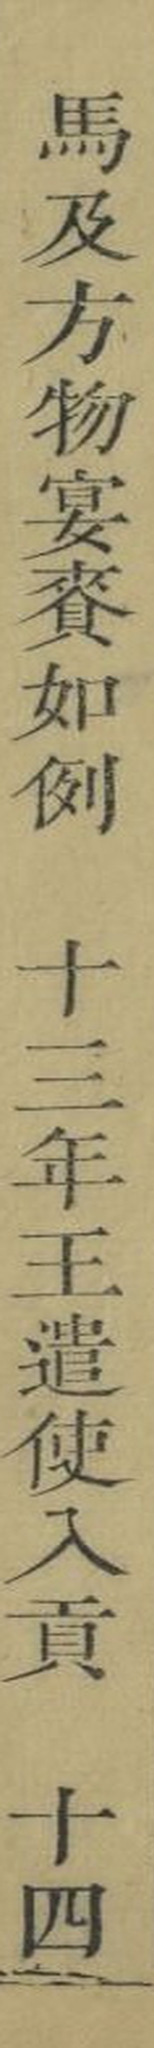馬及方物宴賚如例十三年王遣使入貢十四
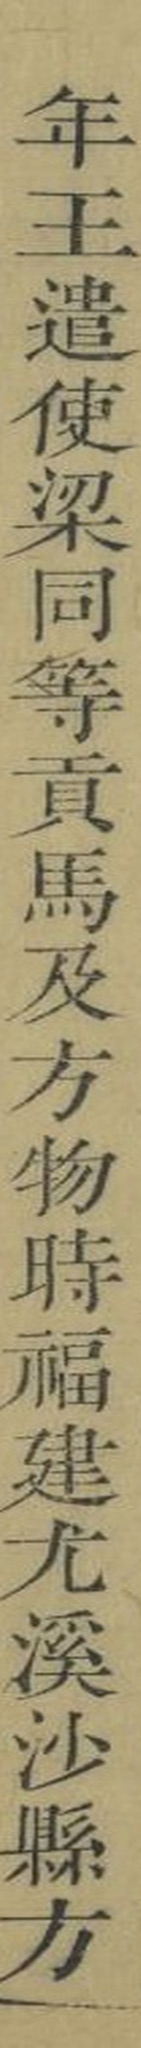年王遣使梁同等貢馬及方物時福建尤渓沙県方
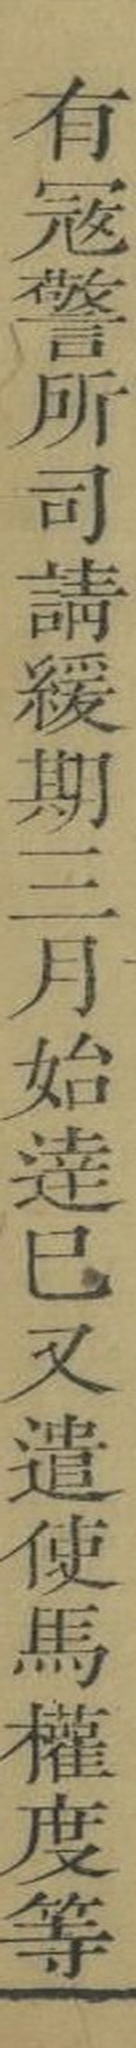有寇警所司請緩期三月始達巳又遣使馬権度等

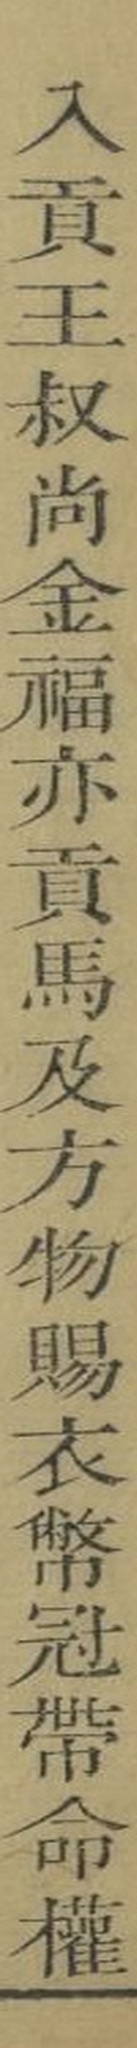入貢王叔尚金福亦貢馬及方物賜衣幣冠帯命権
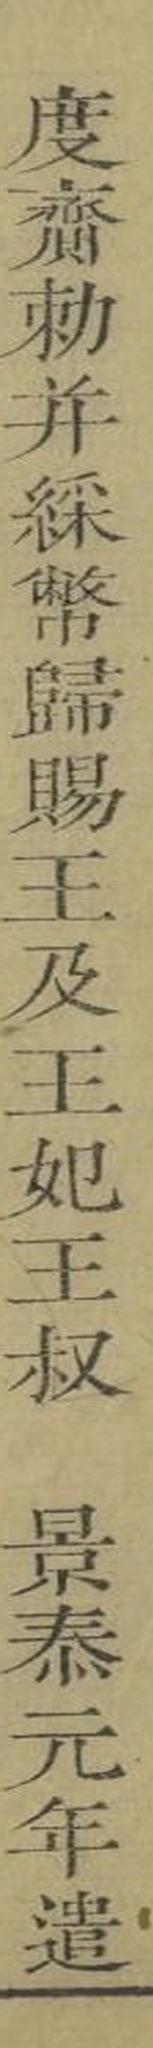度齎勅并綵幣帰賜王及王妃王叔景泰元年遣
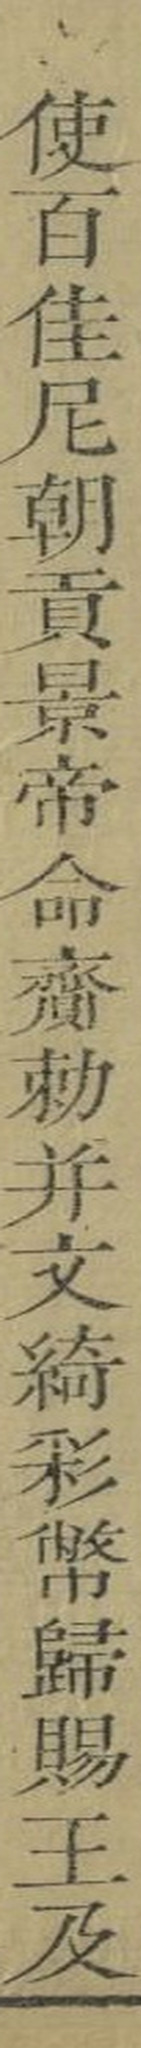使百佳尼朝貢景帝命齎勅并文綺彩幣帰賜王及
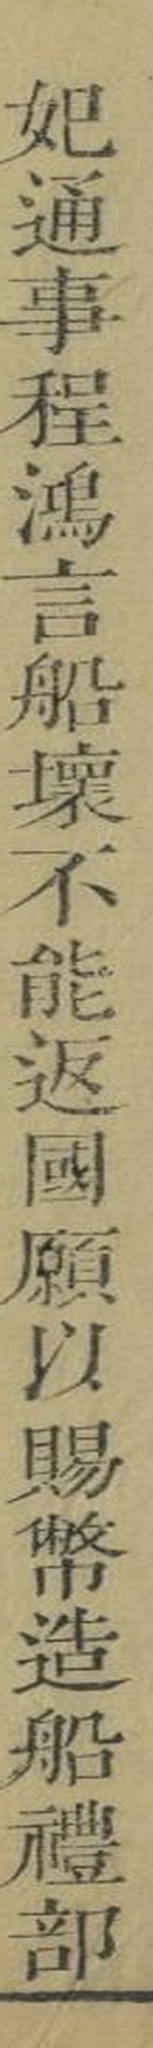妃通事程鴻言船壊不能返国願以賜幣造船礼部
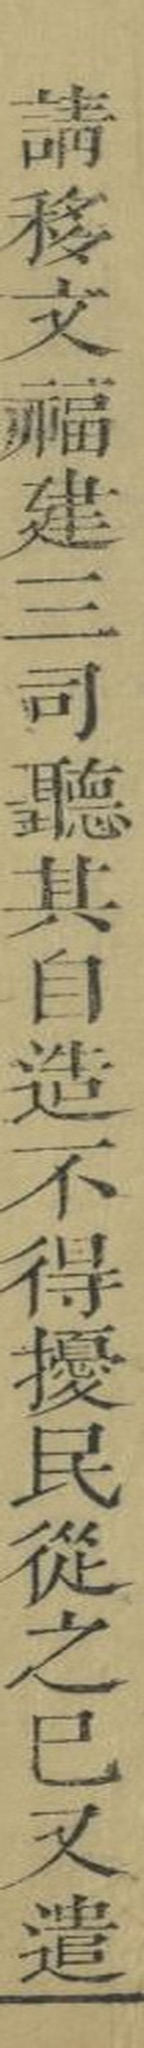請移文福建三司聴其自造不得擾民従之巳又遣
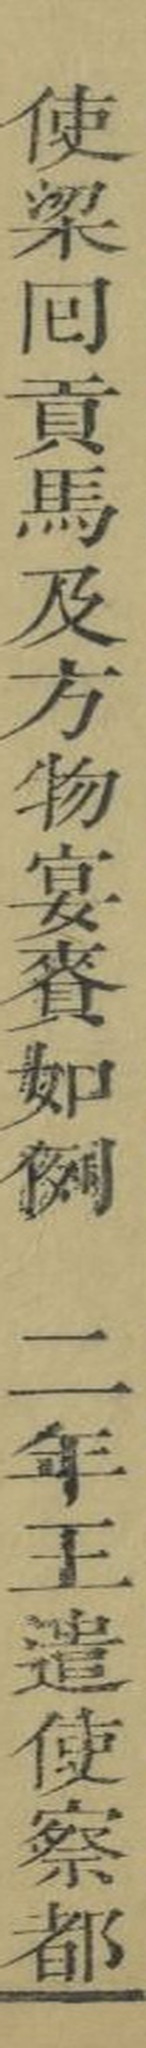使梁回貢馬及方物宴賚如例二年王遣使察都
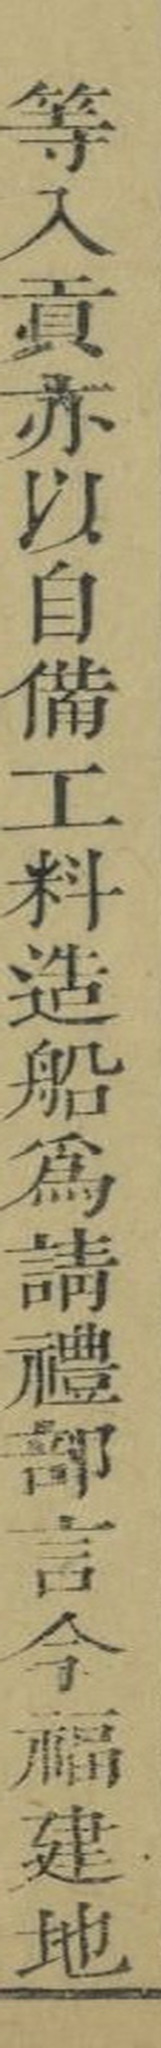等入貢亦以自備工料造船為請礼部言今福建地
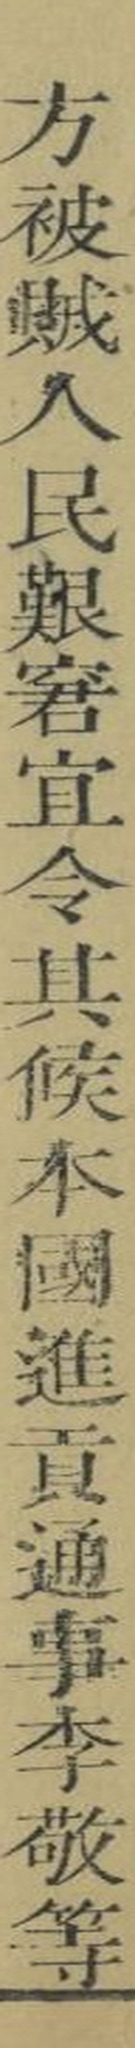方被賊人民艱窘宜令其候本国進貢通事李敬等
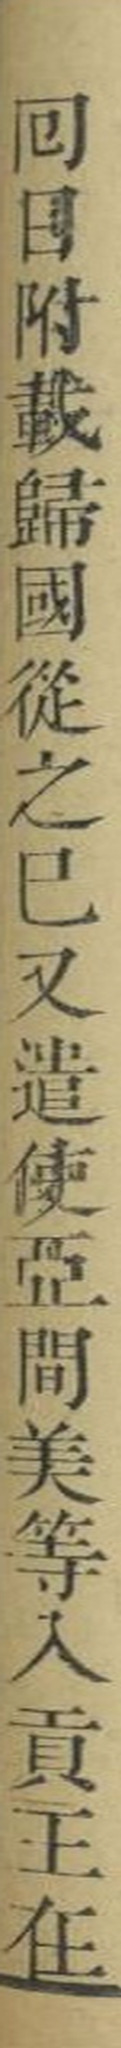回日附載帰国従之巳又遣使亜間美等入貢王在
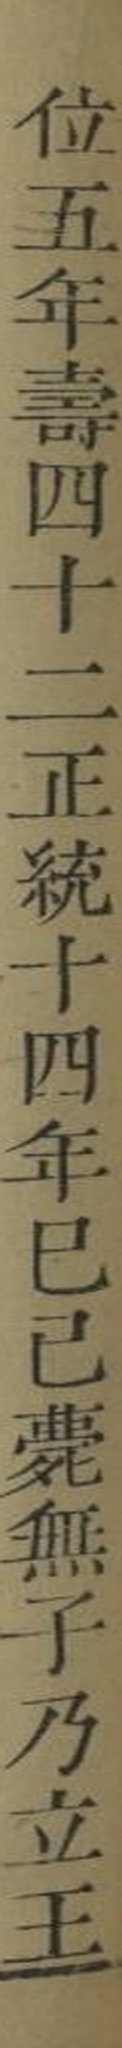位五年寿四十二正統十四年巳已薨無子乃立王
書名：中山伝信録 巻三
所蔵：University of the Ryukyus Library
